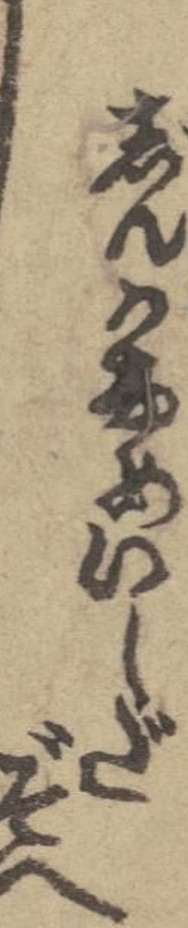じんかなめいしだ
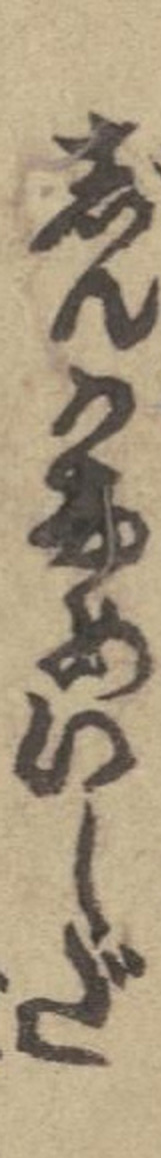じんかなめいしだ
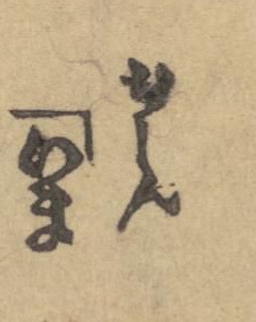ぢしん
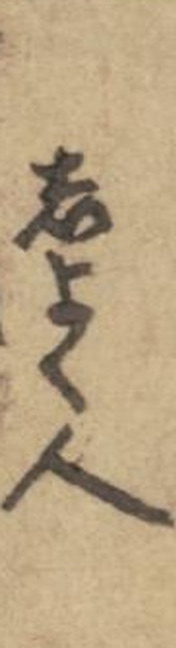しよく人
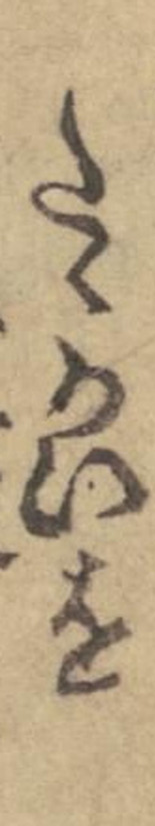たゝかいを
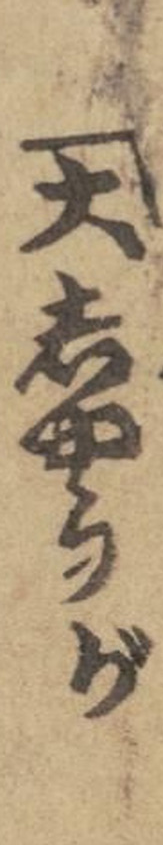〽大しやうが
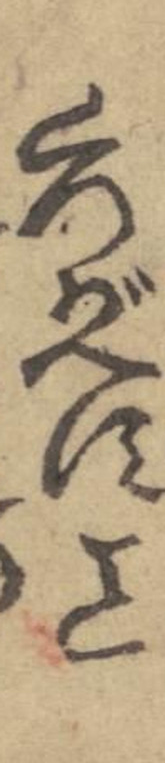くつがへすこと
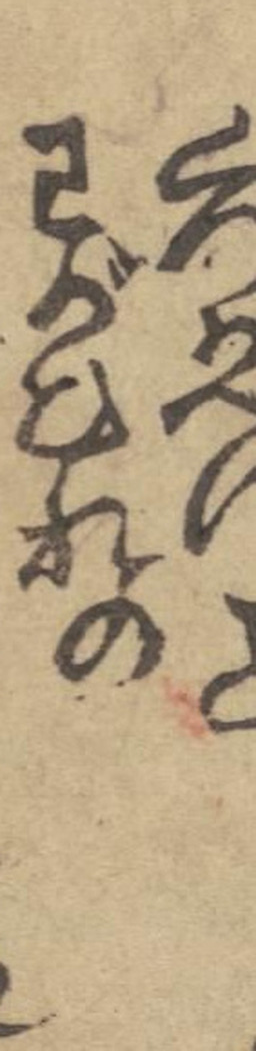わがひれの
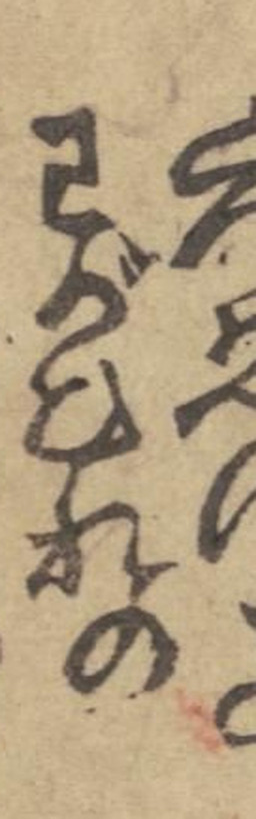わがひれの
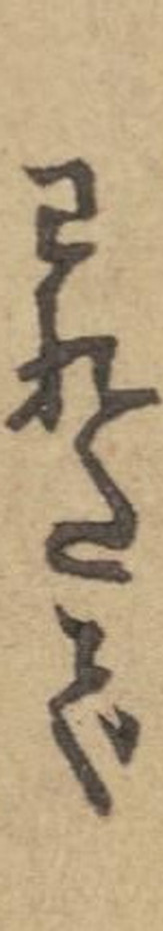われたで
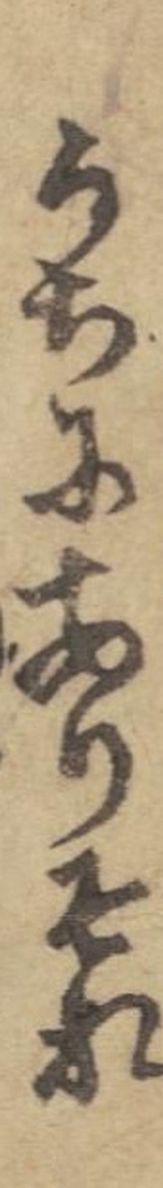うちにありそれ
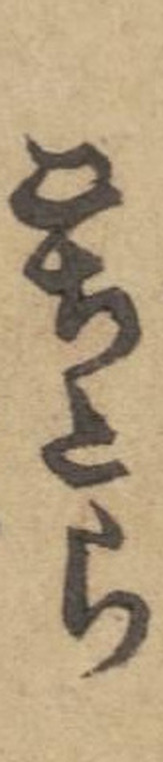こちとら
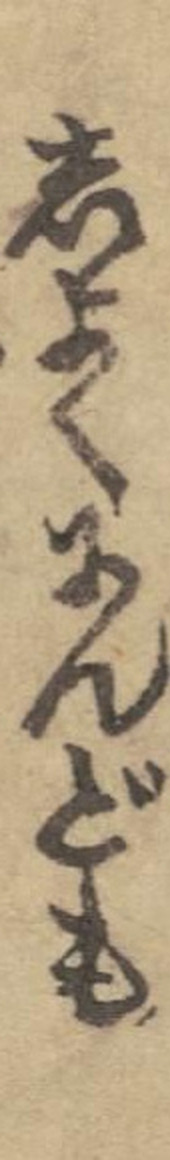しよくにんども
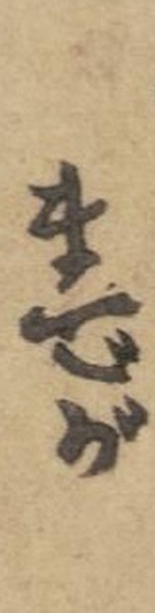までが
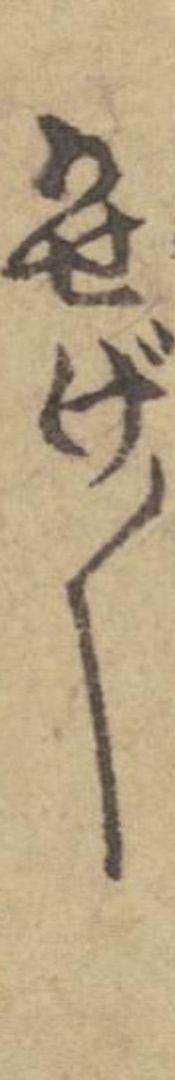かせげ〳〵
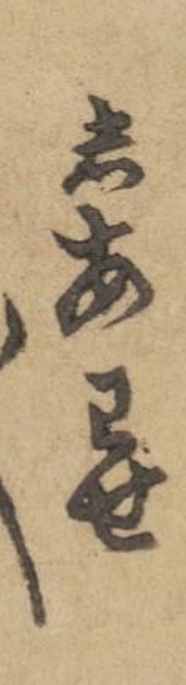しあわせ
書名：入用御間商賣競
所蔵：東京大学地震研究所図書室 Earthquake Research Institute Library, The University of Tokyo, JAPAN
